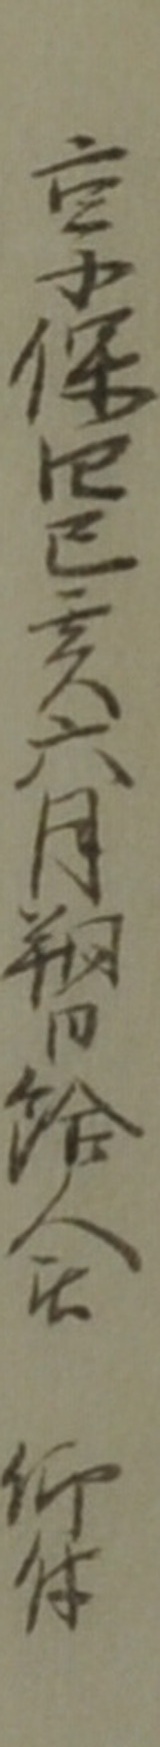享保四己亥六月朔日給人被仰付
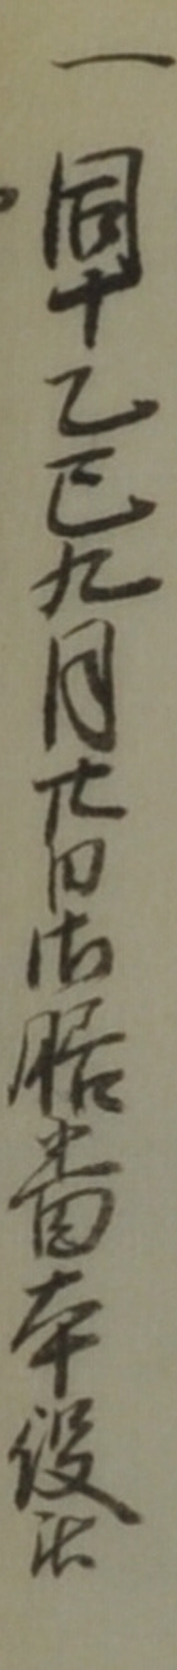一同十乙巳九月廿日御膳番本役被
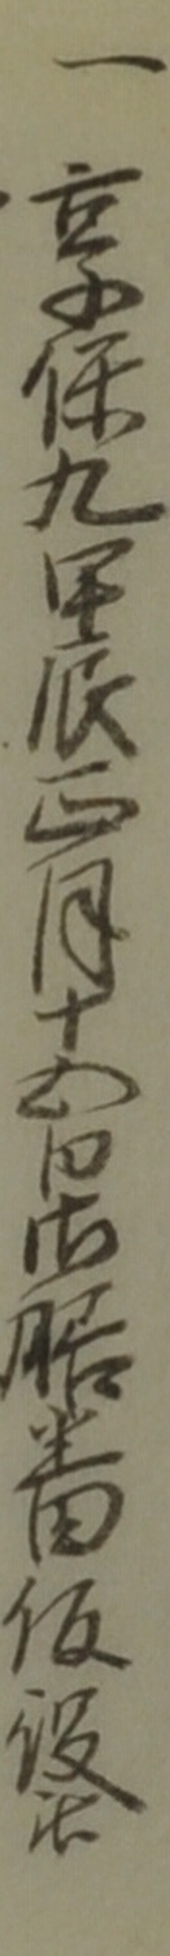一享保九甲辰正月十五日御膳番仮役被
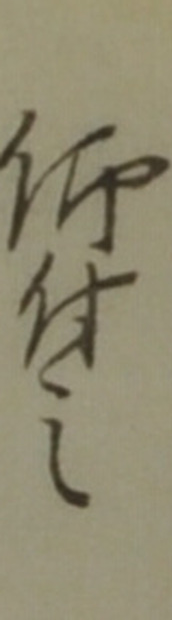仰付之
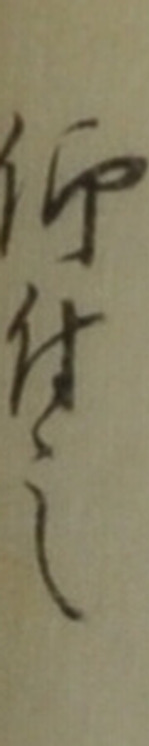仰付之
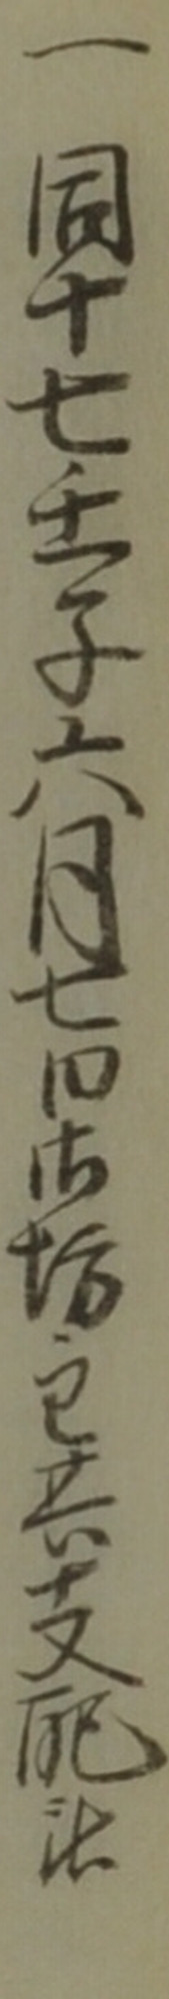一同十七壬子六月七日御坊主共支配被
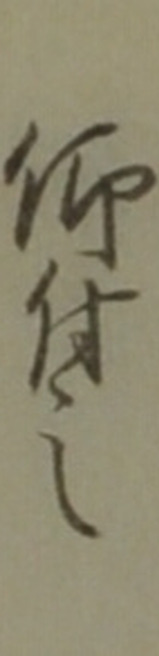仰付之
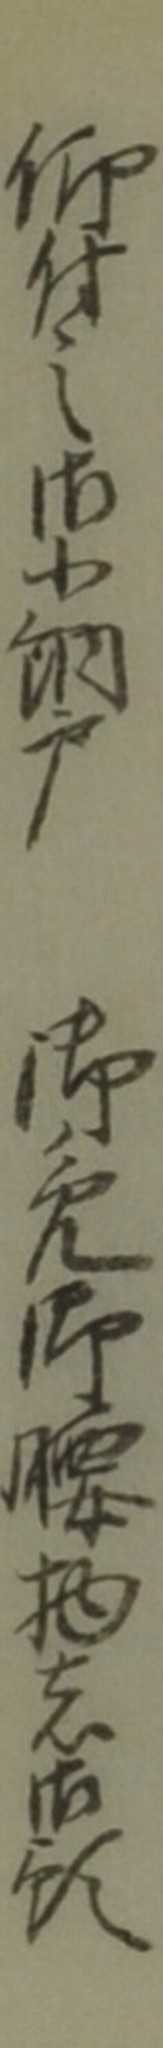仰付之御小納戸御免御腰物者御預
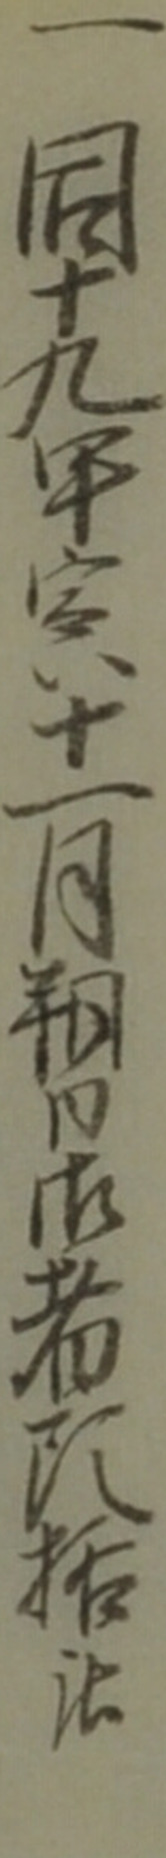一同十九甲寅十一月朔日御者頭格被
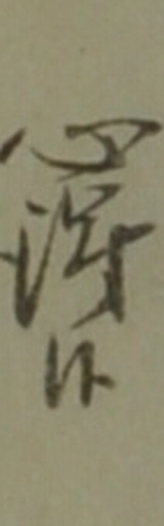心得候
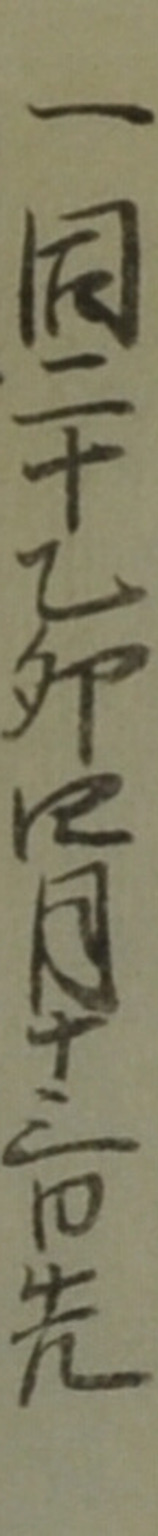一同二十乙卯四月十三日先
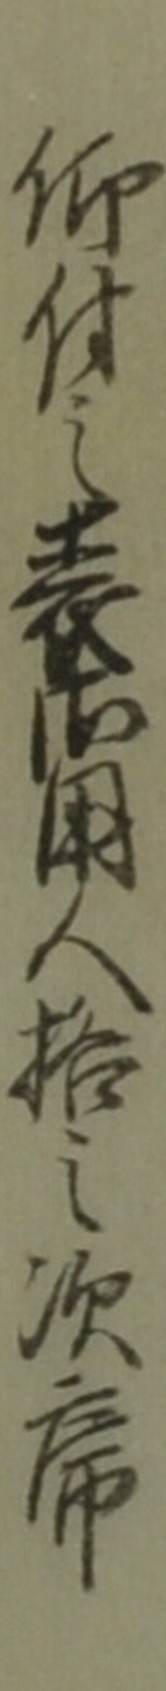仰付之表御用人格之次席
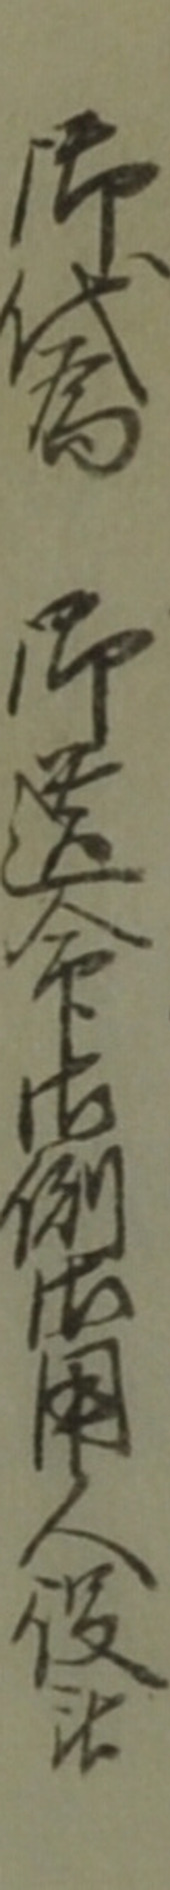御代為御遺命御側御用人役被
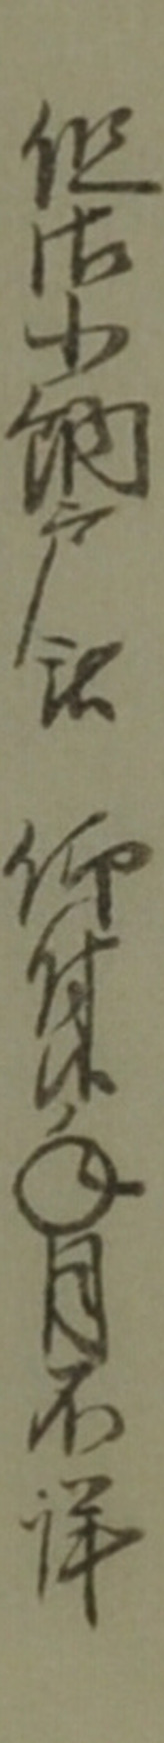但御小納戸被仰付候年月不詳
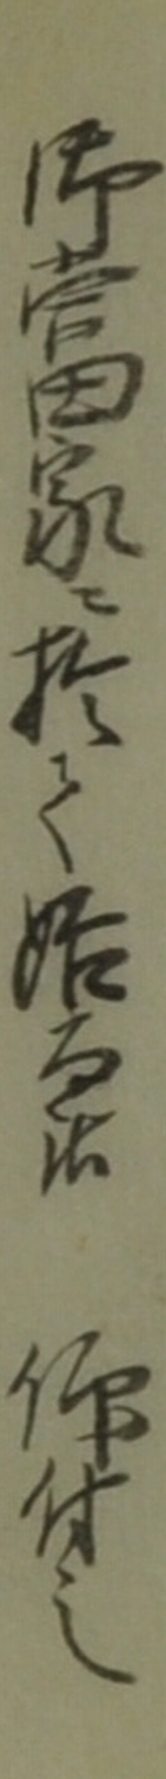御当家ニ於て始而被仰付之
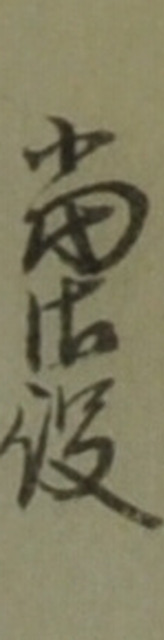当御役
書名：諸御役代々録（五）
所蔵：伊那市立高遠町図書館・合同会社AMANE
